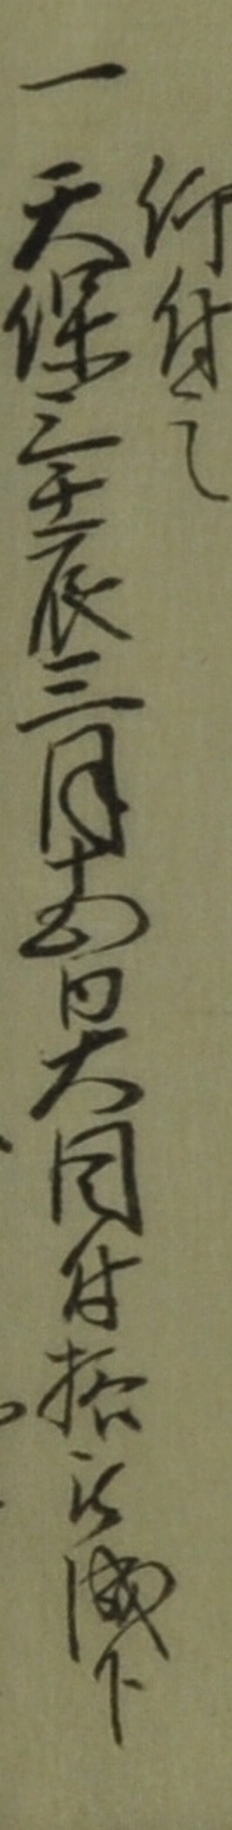一天保壬辰三月十五日大目付格被成下
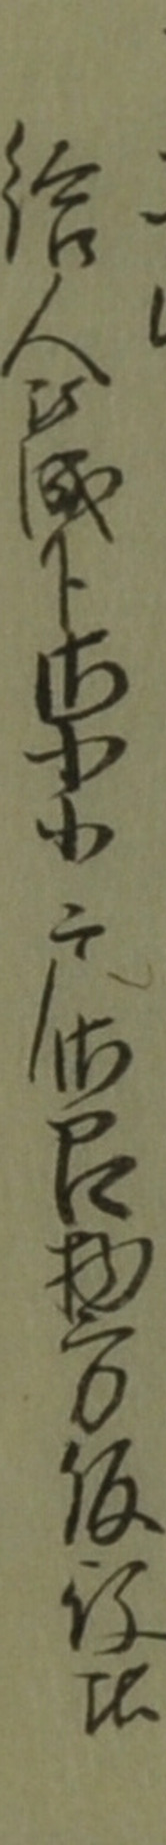給人被成下御小小戸御召物方仮役被
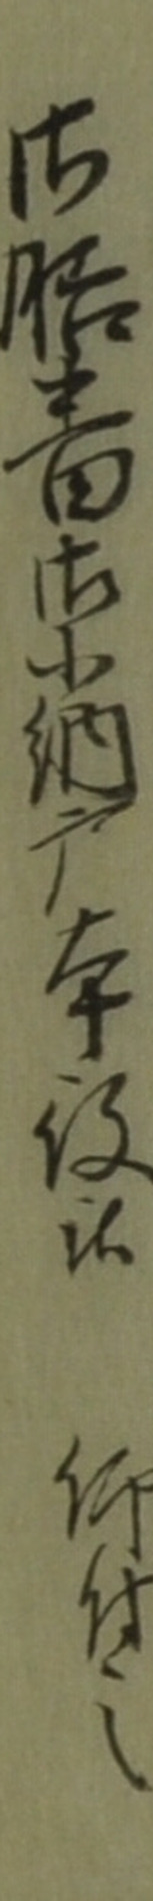御膳番被小納戸本役被仰付之
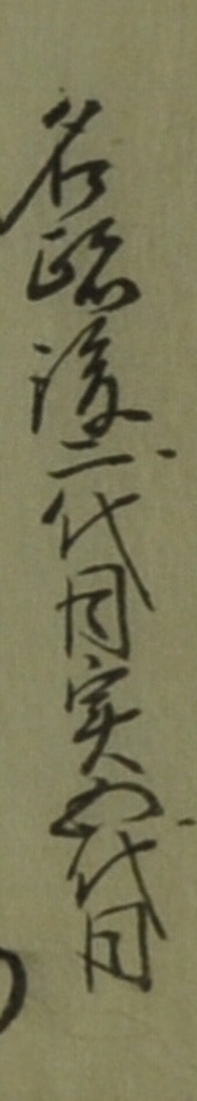名跡後二代目実五代目
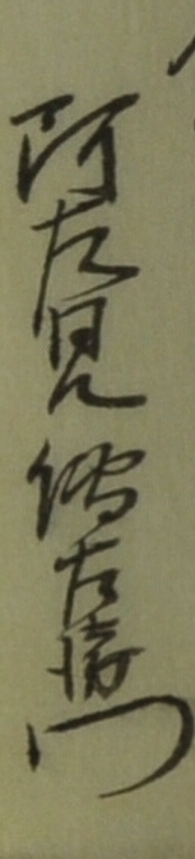阿左見伝右衛門

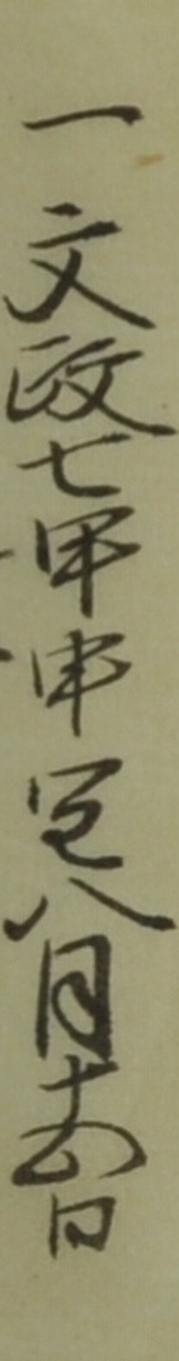一文政七甲申閏八月十五日
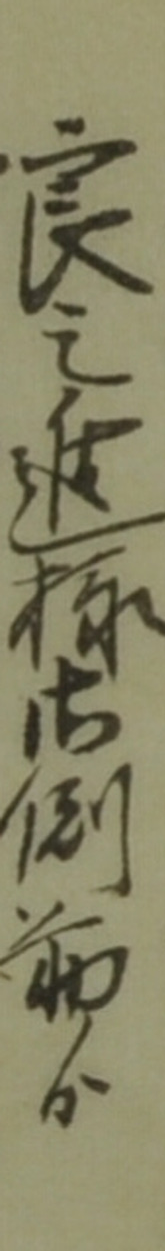良之進様御側勤ゟ
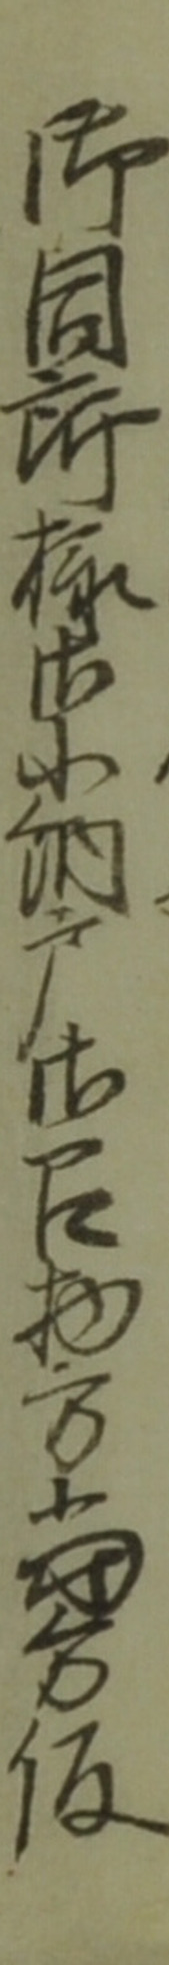御同所様御小納戸御召物方当分仮
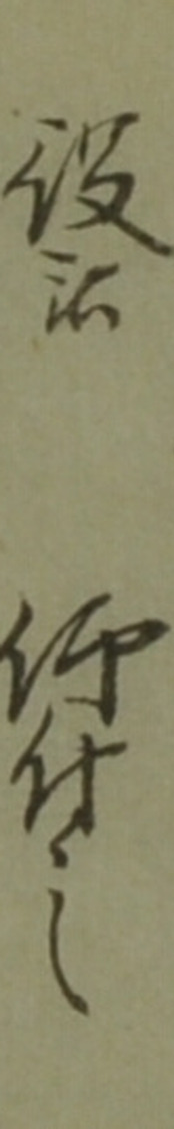役被仰付之
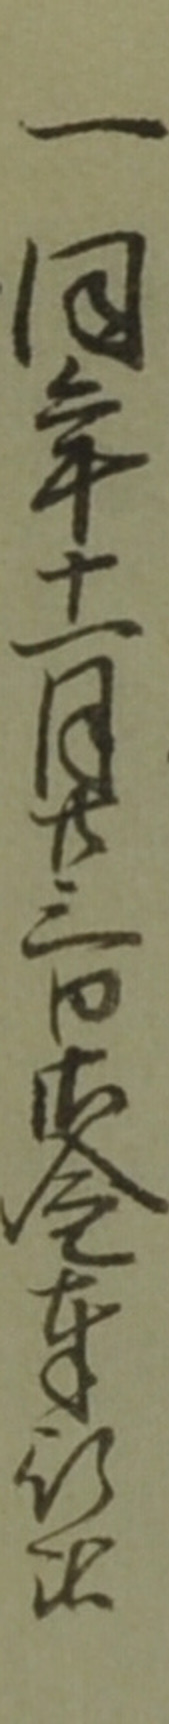一同十一月廿三日御勤奉行被
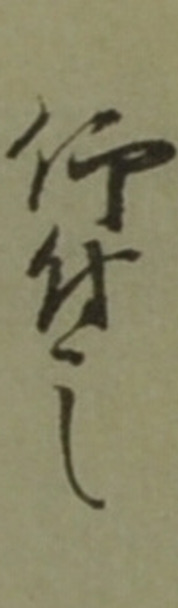仰付之
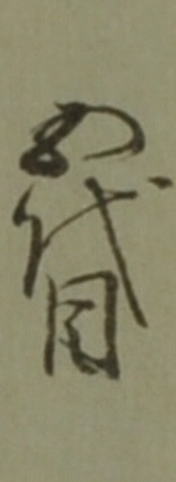五代目
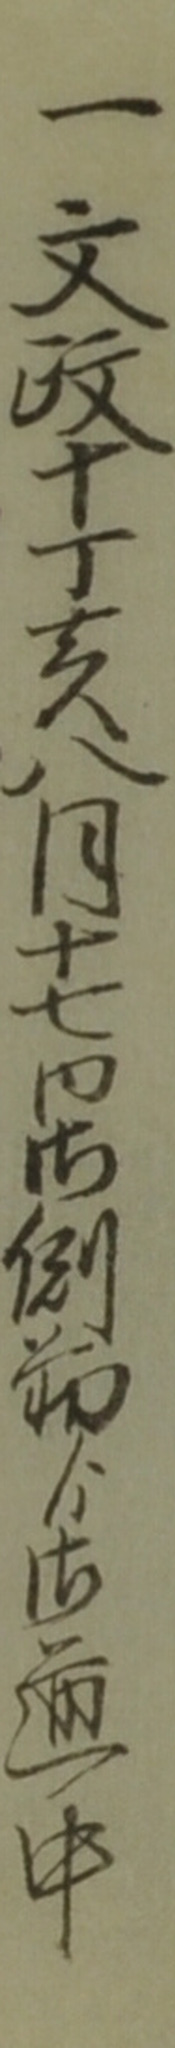一文政十丁亥八月十七日御側勤ゟ御道中
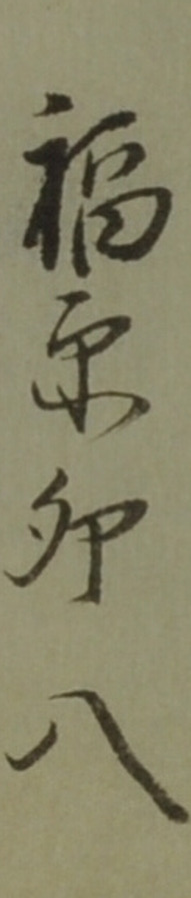福原卯八
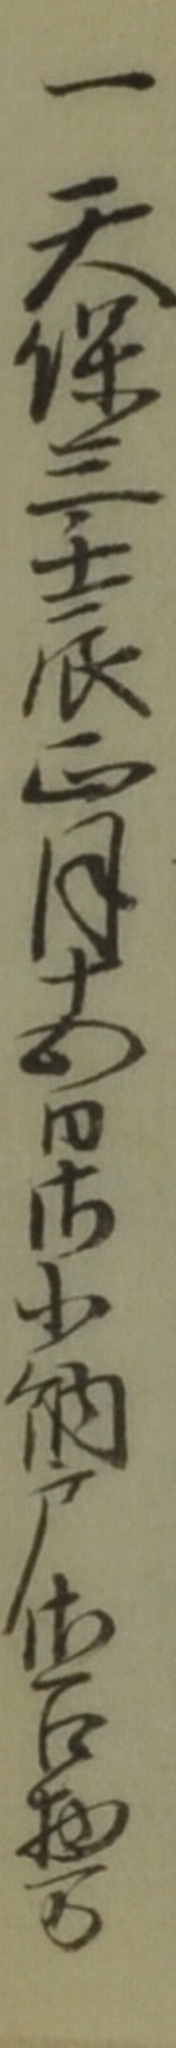一天保三壬辰正月十五日御小納戸御召物方
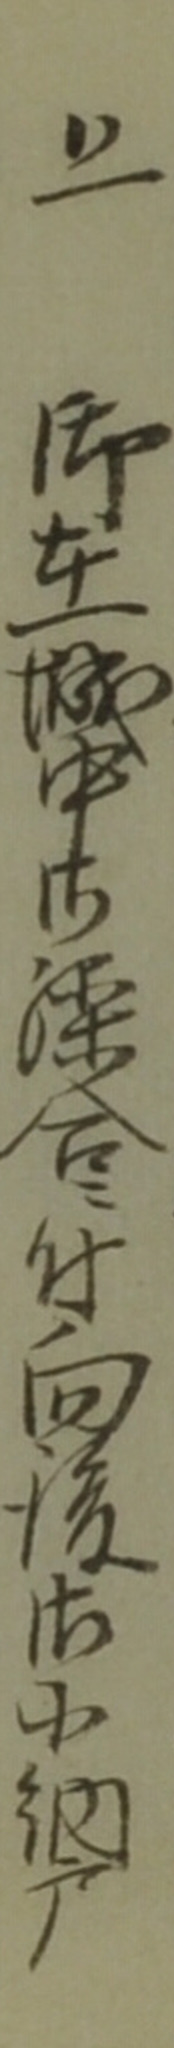且御在城中御繰合ニ付向後御小納戸
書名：諸御役代々録（四）
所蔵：伊那市立高遠町図書館・合同会社AMANE
